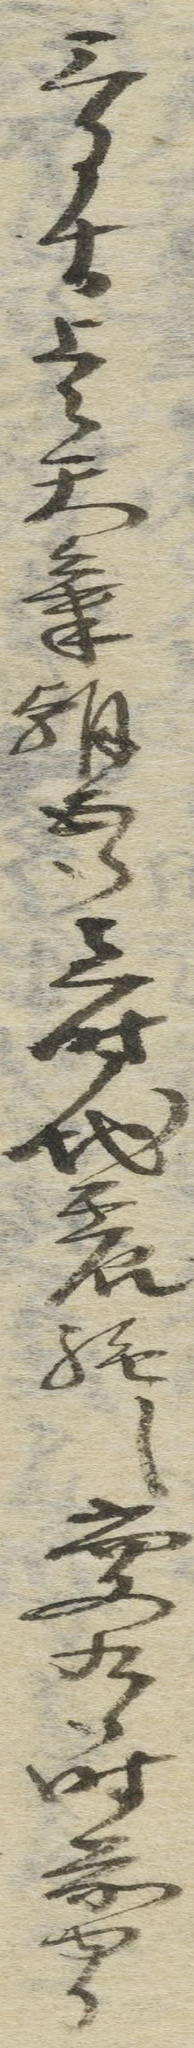三月十日上々天気朝五ッ過時地震強し尚又九ッ時前ゆり
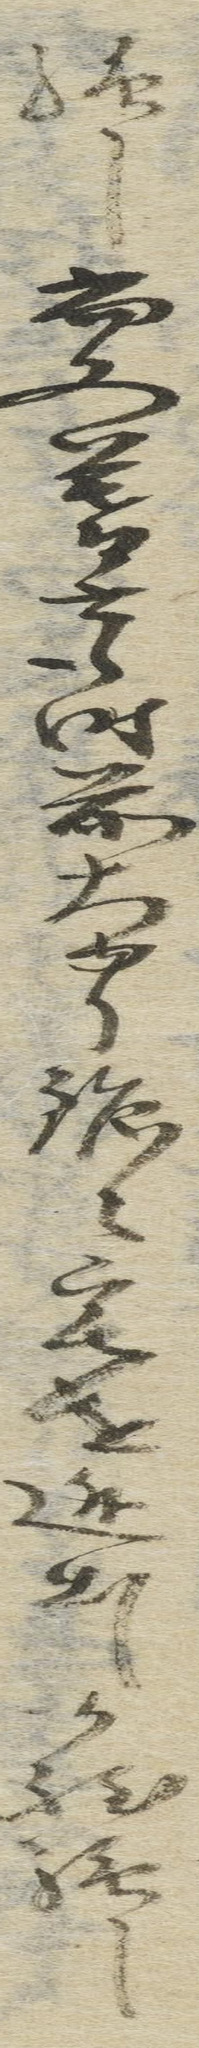強し尚又暮六ッ時前大ゆり銘々宅を逃出し候程強し
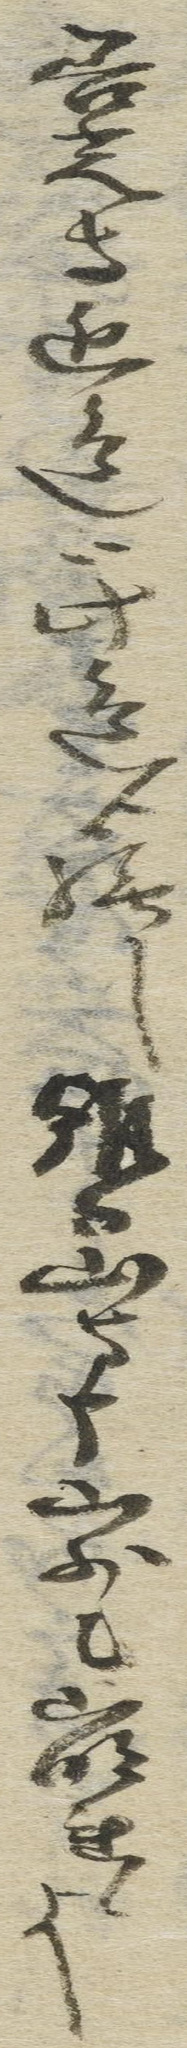善光寺近辺ハ此辺ゟ強し朝日山と申山少し崩れ候よし
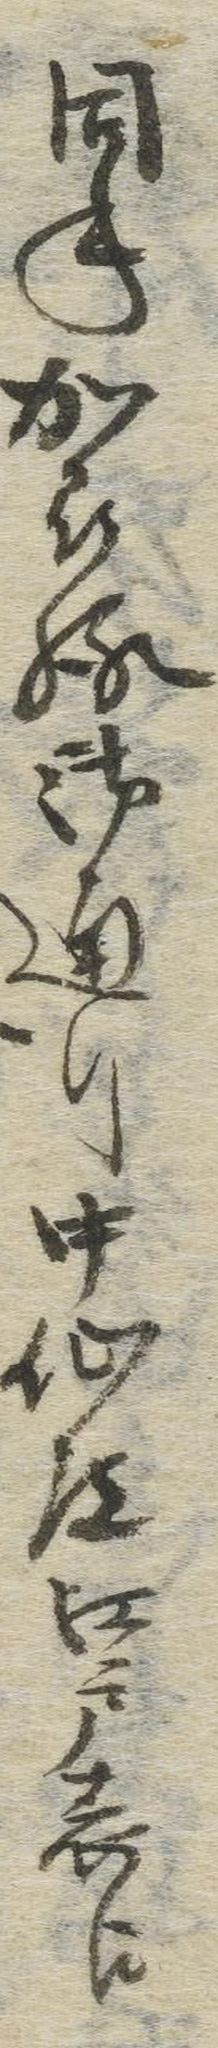同年加州様御通行中仙道江戸表江
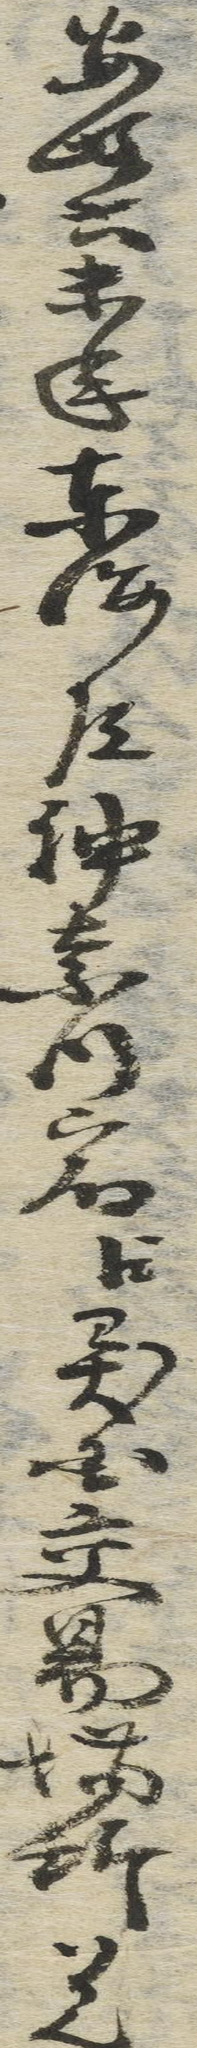安政六未年東海道神奈川宿江異国交易場所御見
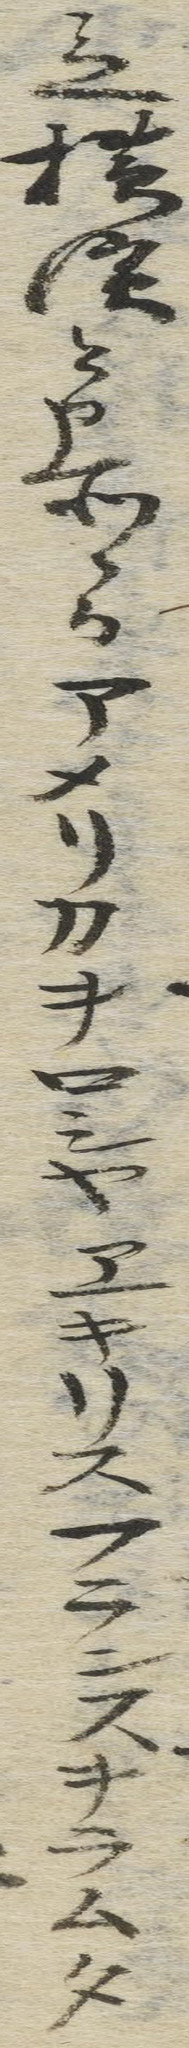立横浜と申所二而アメリカヲロシヤエキリスフランスヲラムタ
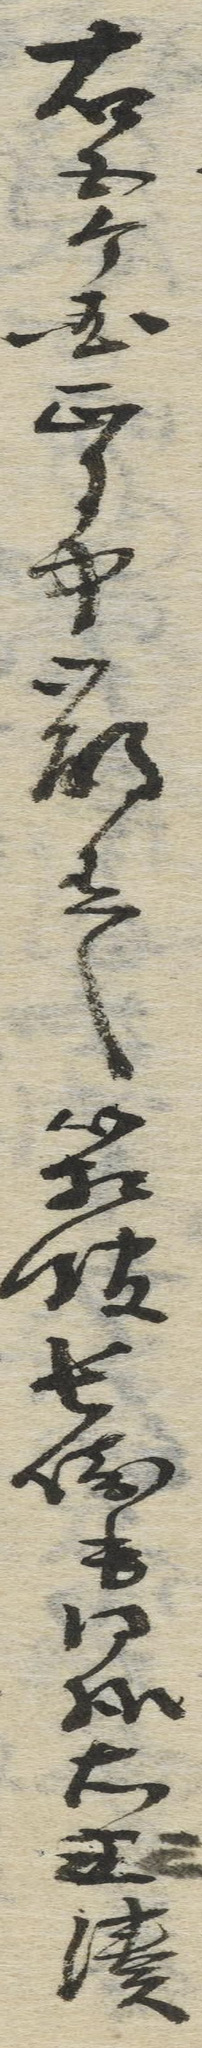右五ヶ国正月中御触有之函館長崎も同様右三湊
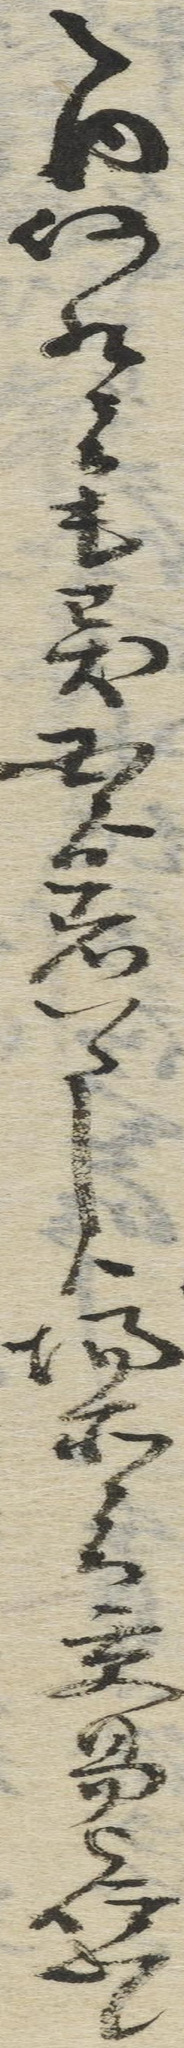之内何れ二而も異国ゟ着いたし候場所二而交易被仰出候
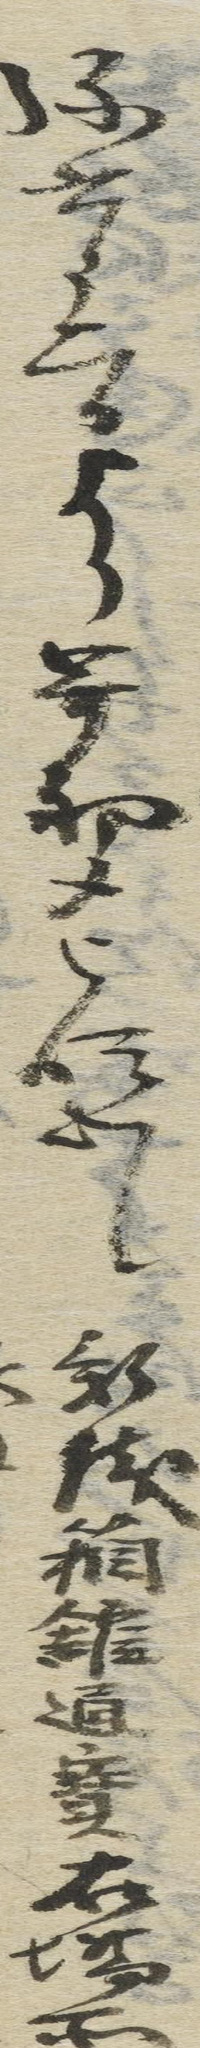弥六月二日より開初メ被仰出候新銭函館通宝右場所
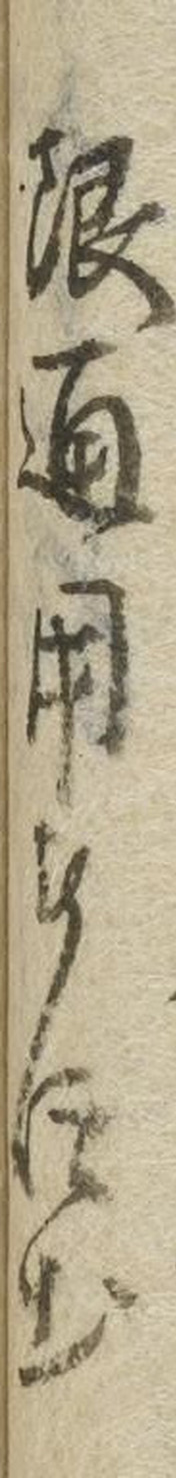限通用被仰出
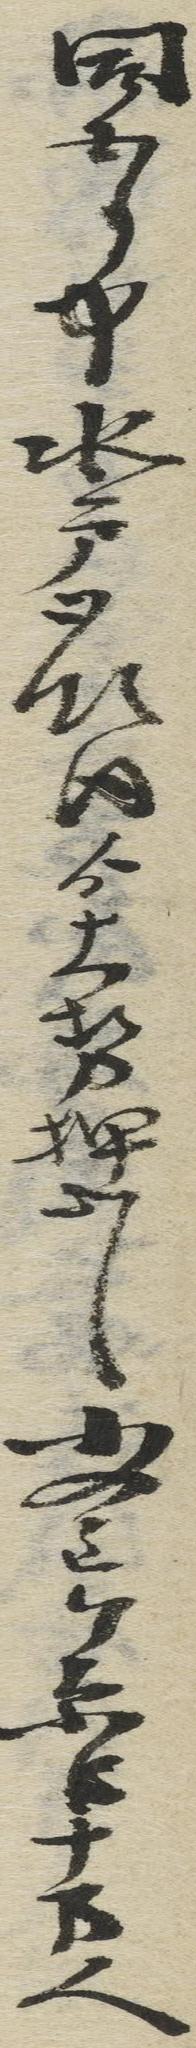同五月中水戸御領内ゟ大勢押出し小金ヶ原江十万人
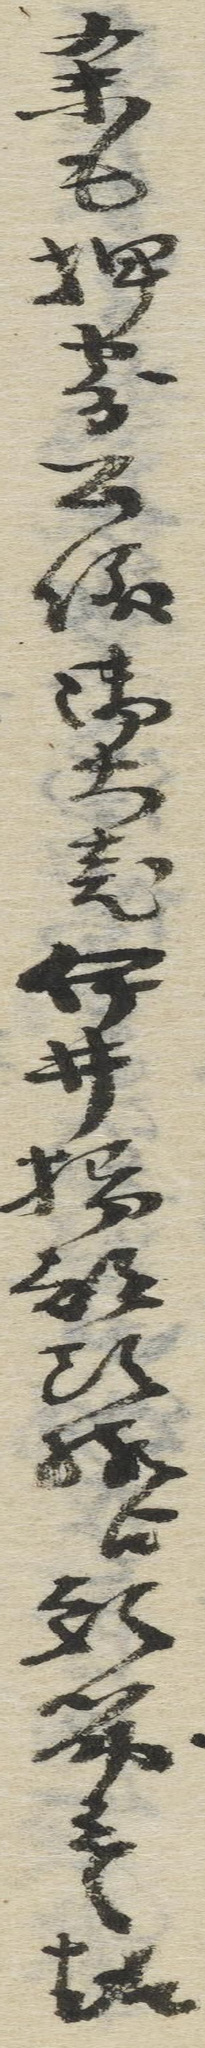余も押寄公儀御大老伊井掃部頭様江願筋有之趣
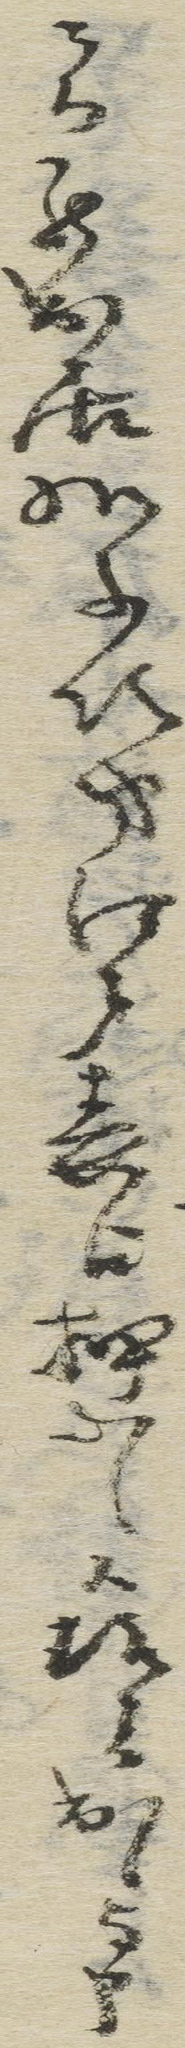二而罷出居様子侍方江戸表江押出し候場二而出候と申
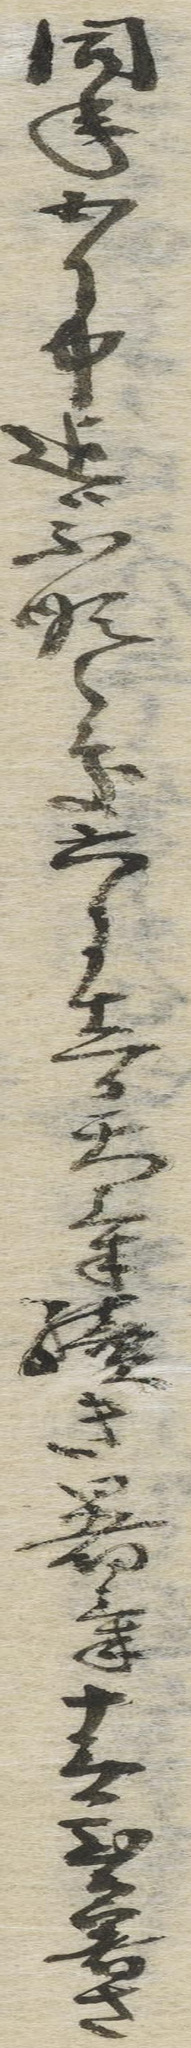同年五月中迄ハ不晴候処六月十二日天気続き暑気十三日至而暑さ
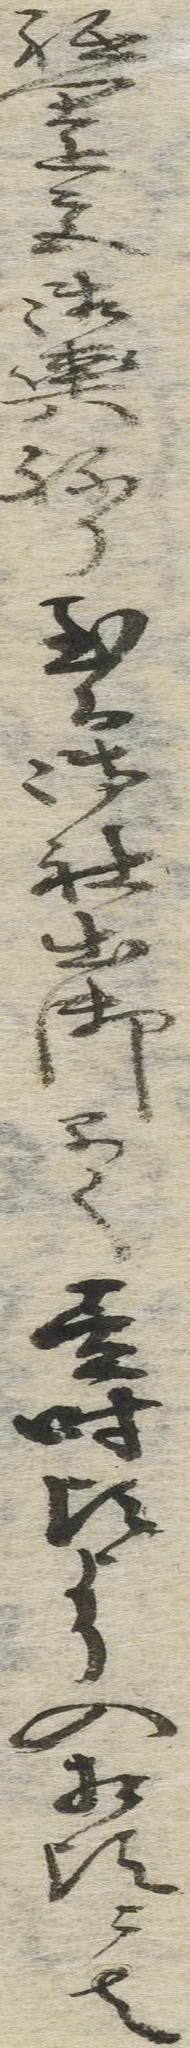強里宮神御輿練り至而御社出御早々昼時頃より入相頃二は
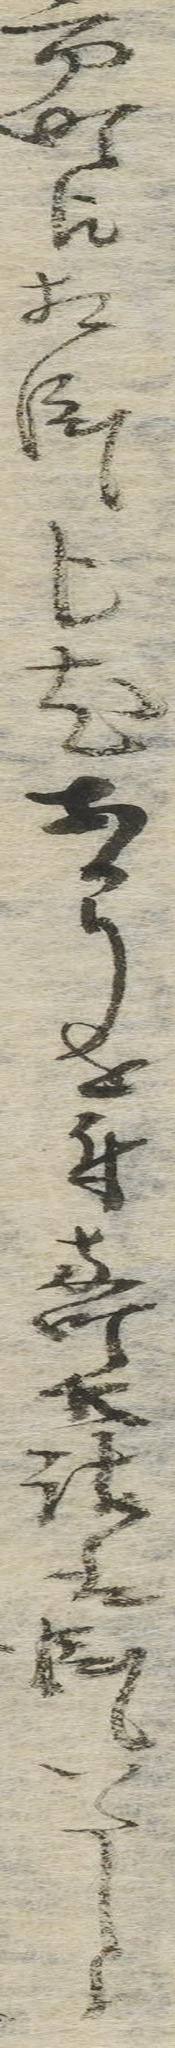市町江相流し申候尤あかりを付両町共詠も流しいたし候
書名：信濃越後　地震書留
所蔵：東京大学地震研究所図書室 Earthquake Research Institute Library, The University of Tokyo, JAPAN
